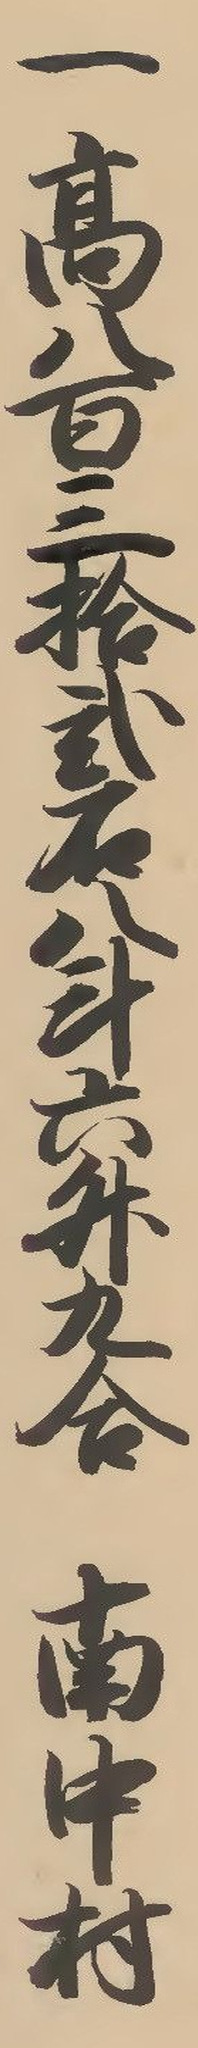一高八百三拾弐石八斗六升九合南中村
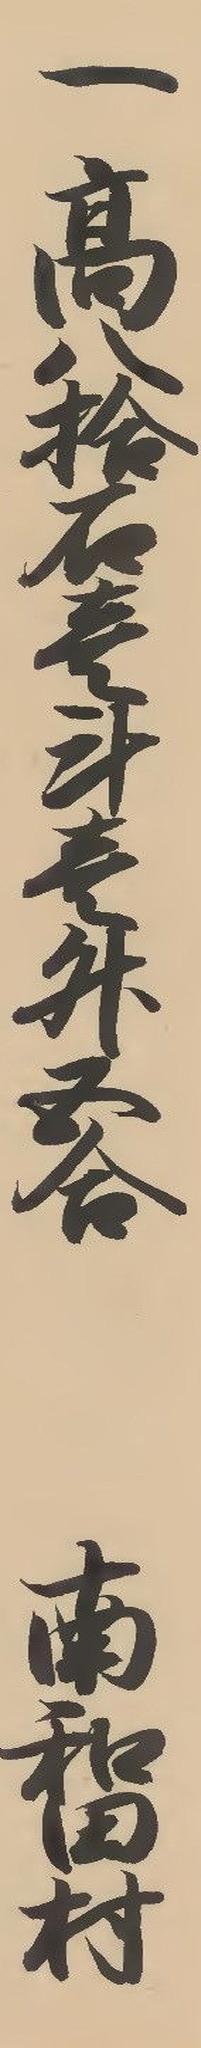一高八拾石壱斗壱升五合南和田村
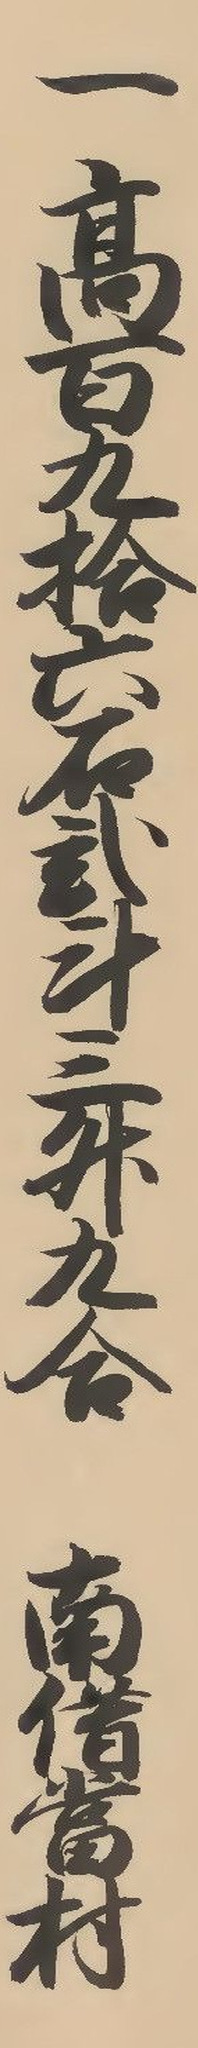一高百九拾六石弐斗三升九合南借当村
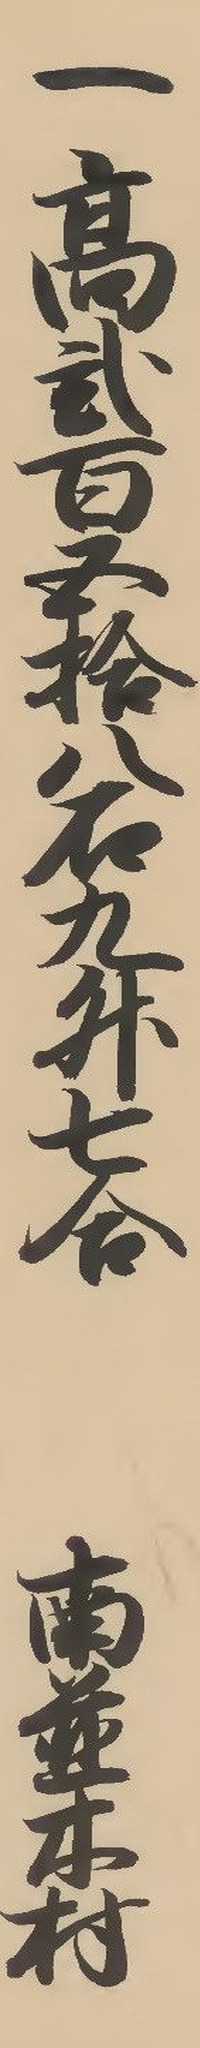一高弐百五拾八石九升七合南並木村
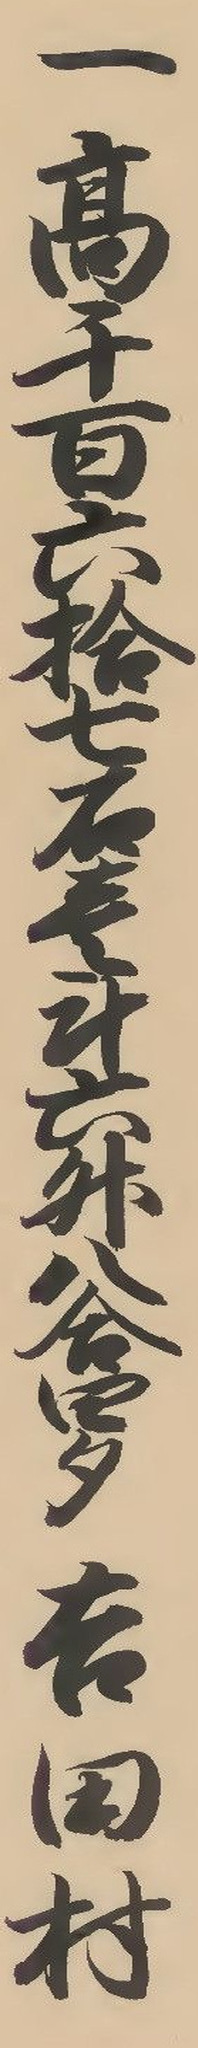一高千百六拾七石壱斗六升八合四勺吉田村

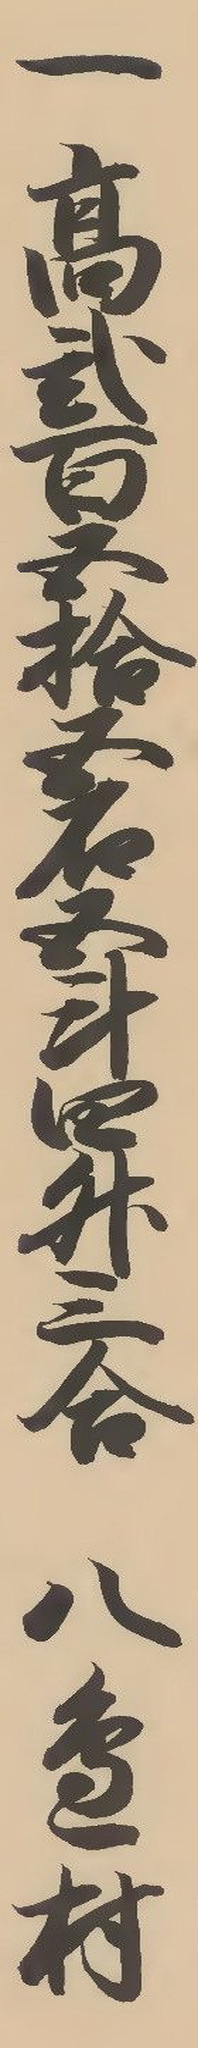一高弐百五拾五石五斗四升三合八辺村
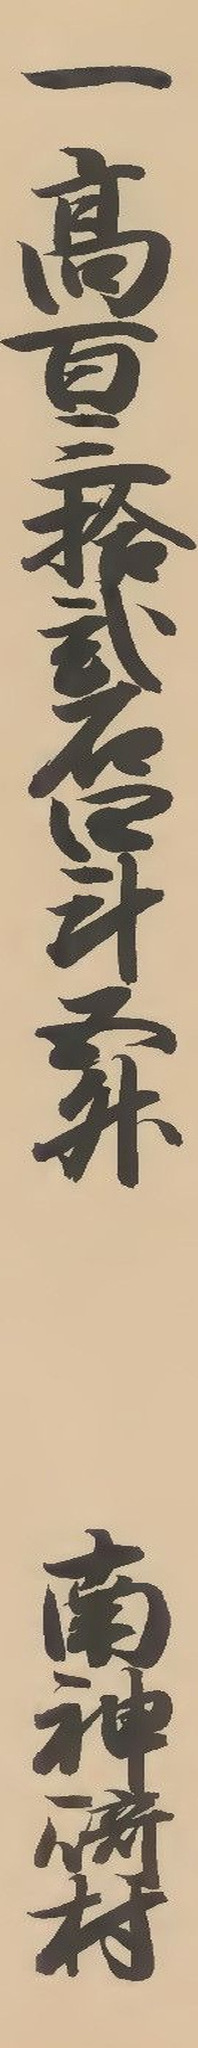一高百三拾弐石四斗五升南神崎村
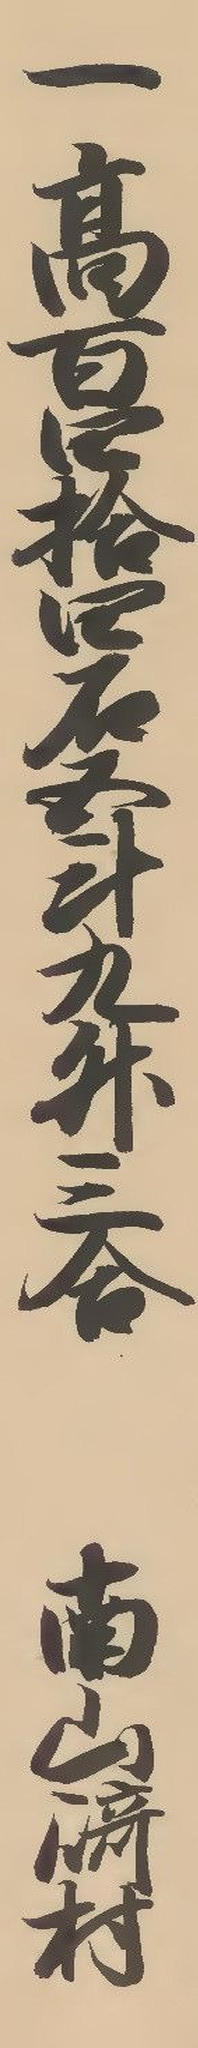一高百四拾四石五斗九升三合南山崎村
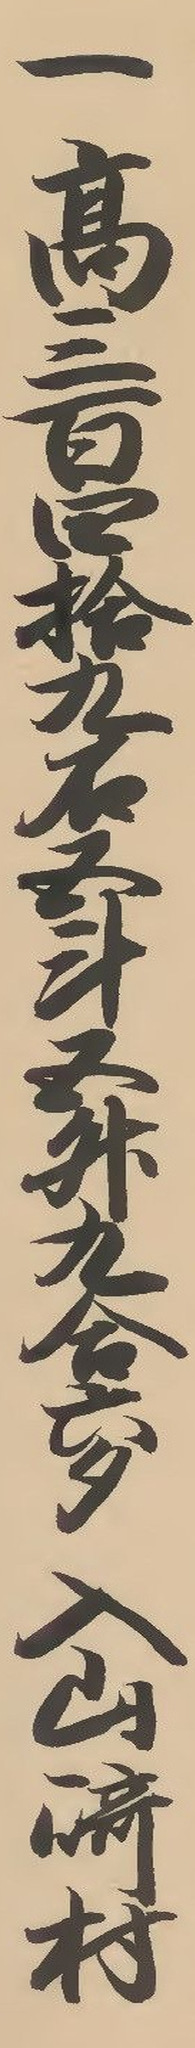一高三百四拾九石五斗五升九合六勺入山崎村
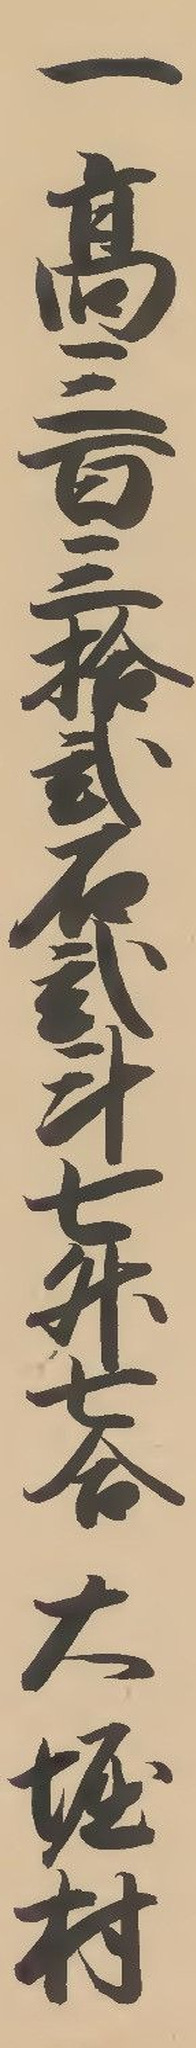一高三百三拾弐石弐斗七升七合大堀村
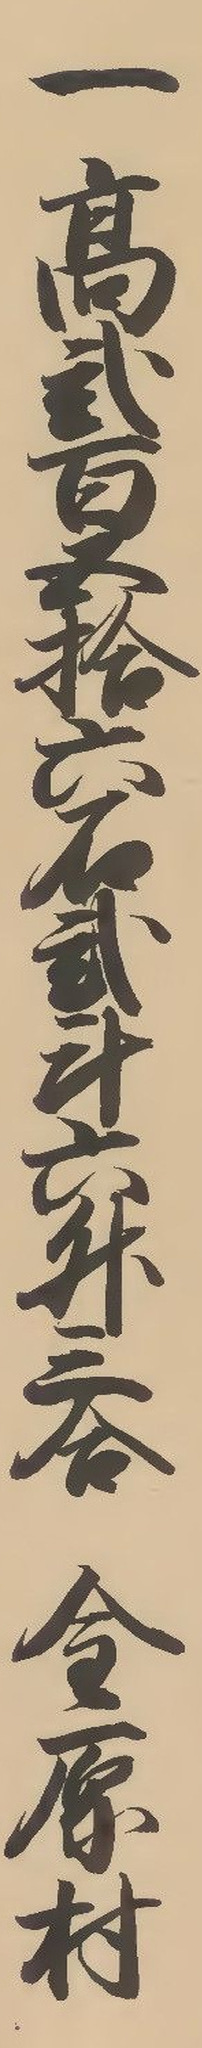一高弐百五拾六石弐斗六升三合金原村
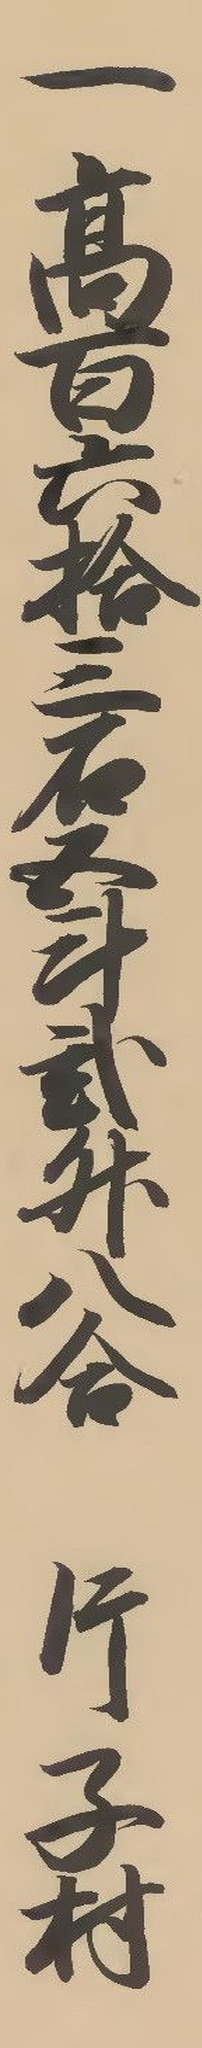一高百六拾三石五斗弐升八合片子村
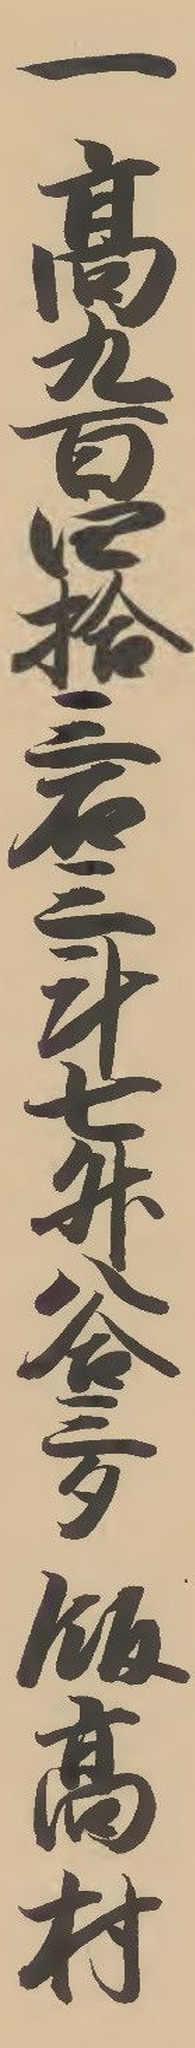一高九百四拾三石三斗七升八合三勺飯高村

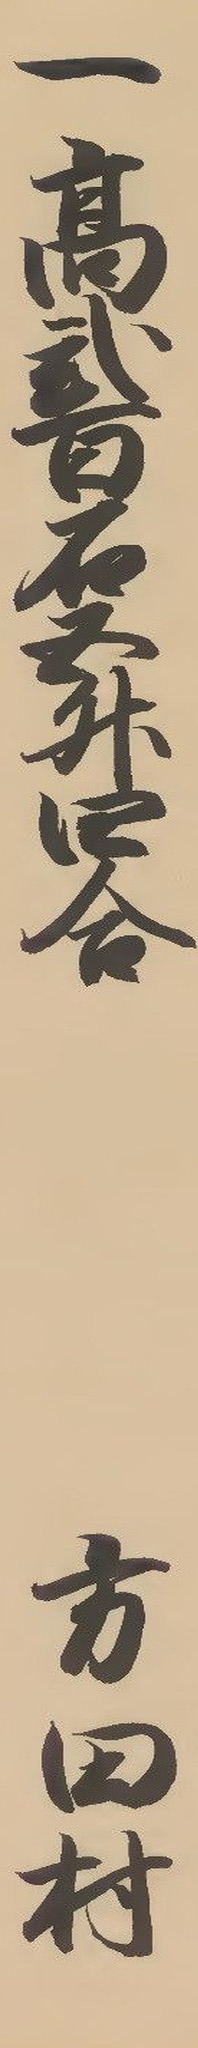一高弐百石五升四合方田村
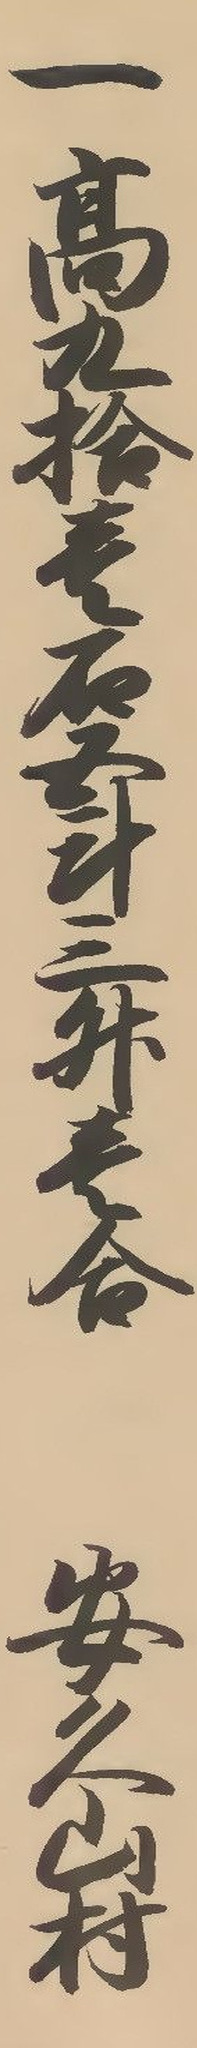一高九拾壱石五斗三升壱合安久山村
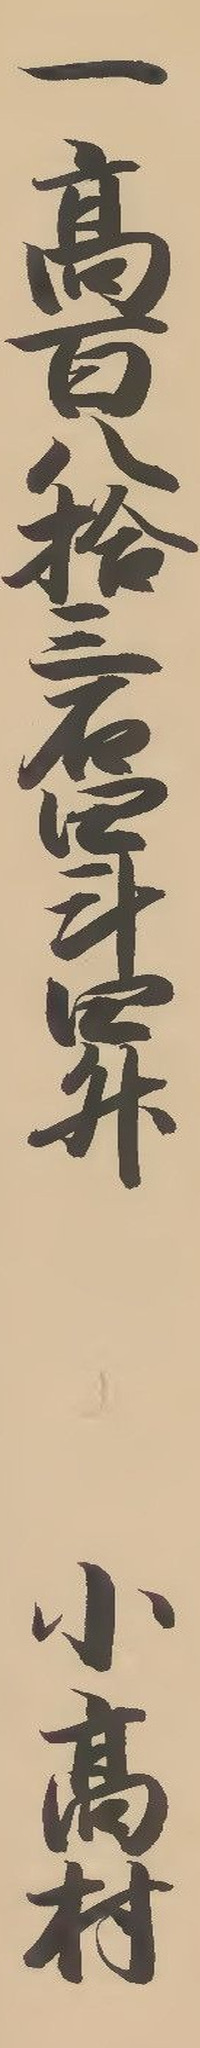一高百八拾三石四斗四升小高村
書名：下総国郷帳
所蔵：国立公文書館 National Archives of Japan
